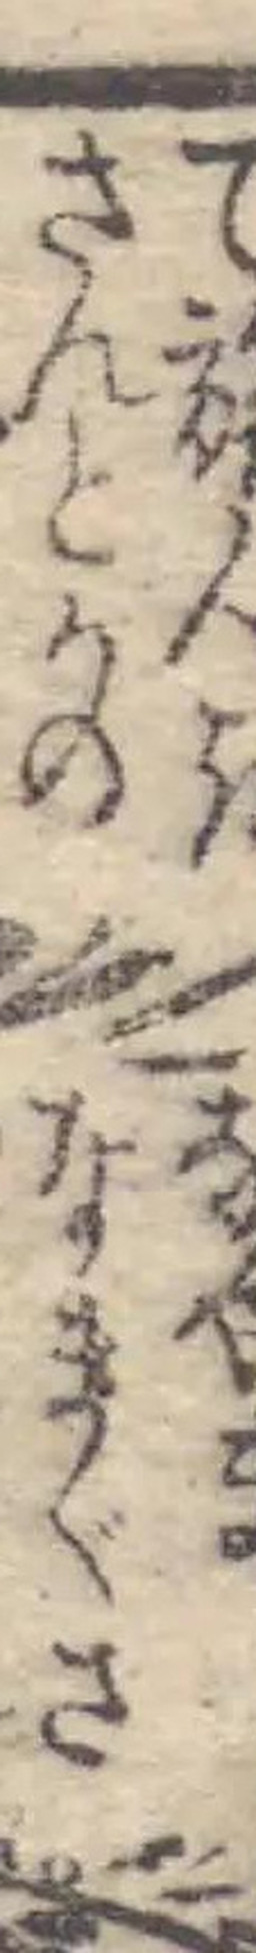さんとかのなまぐさ
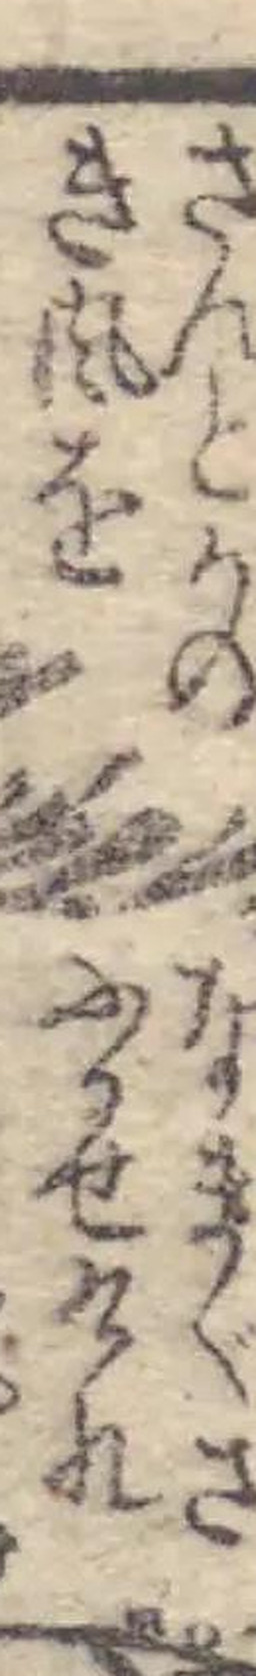き風をふかせけれ
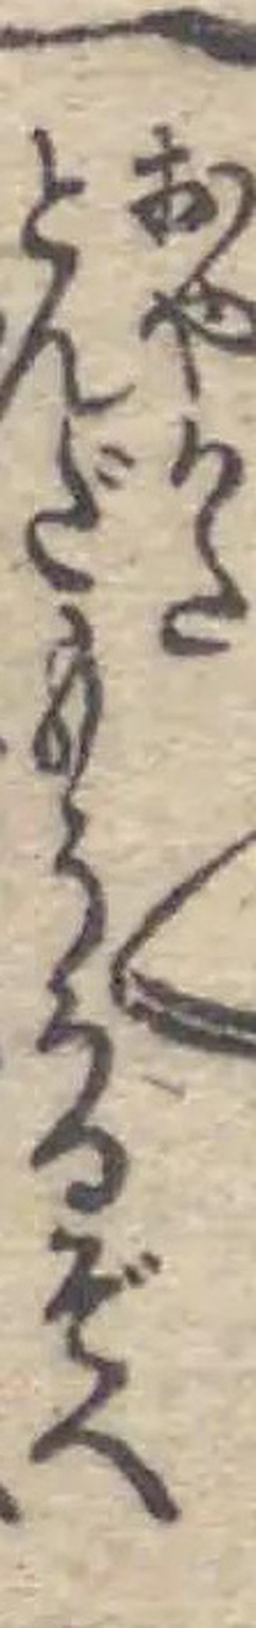とんだもうかるぞへ
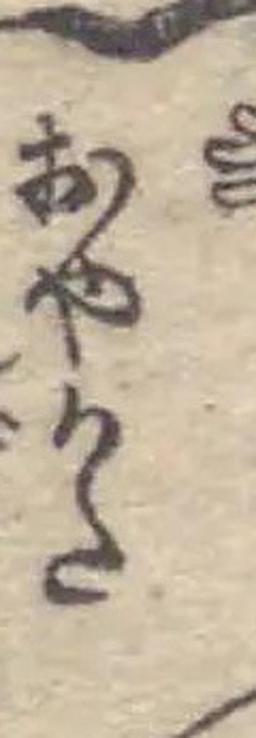おやかた
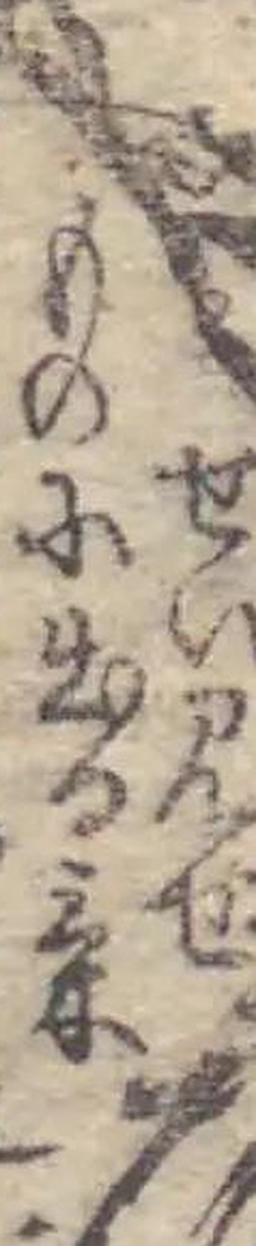ものに出る気
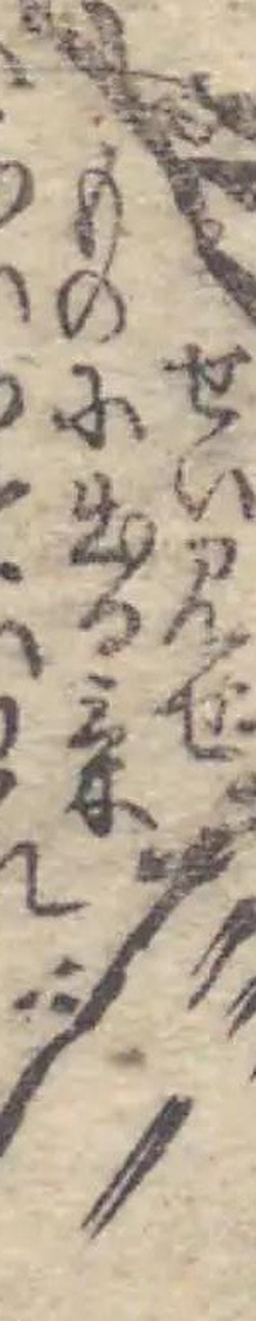ものに出る気
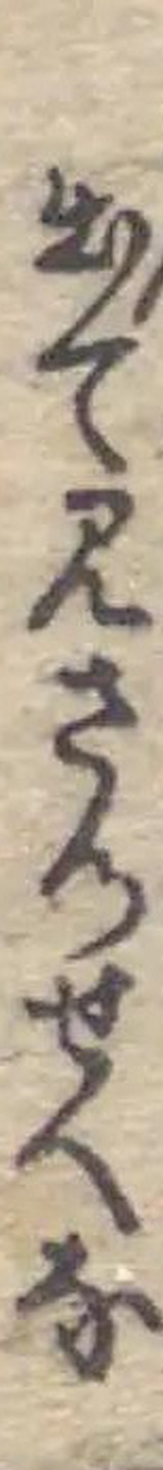出て見さつせへな
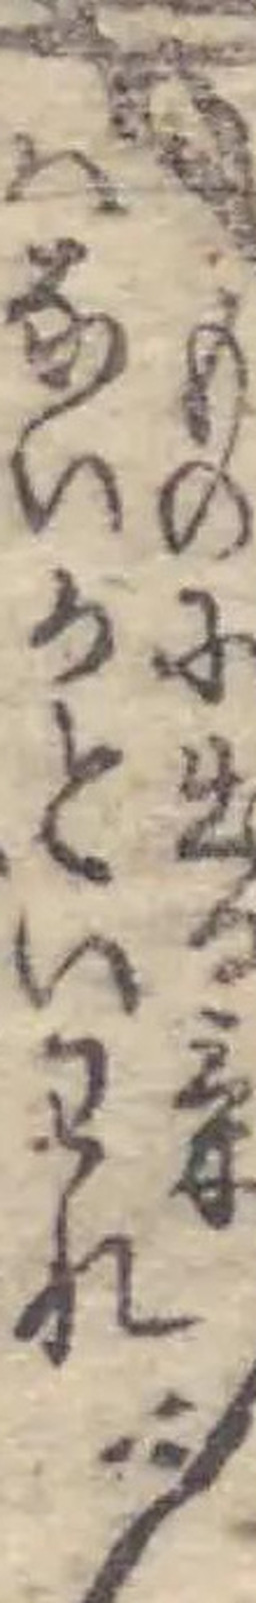はないかといわれ
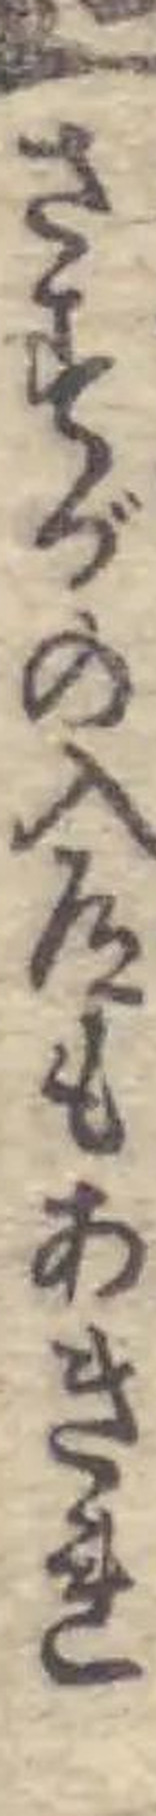さすがの入道もあきれ
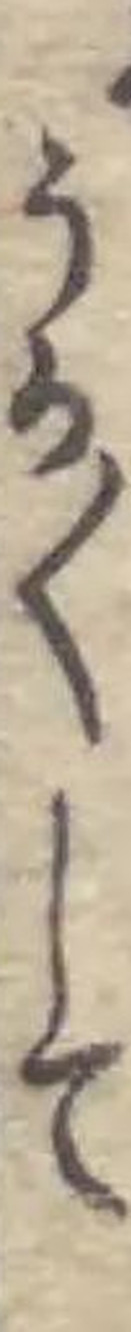うか〳〵して
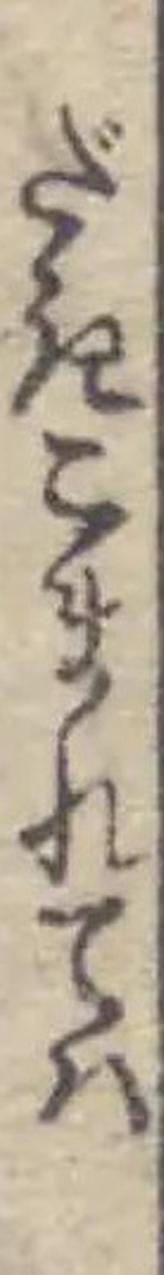だきこまれては
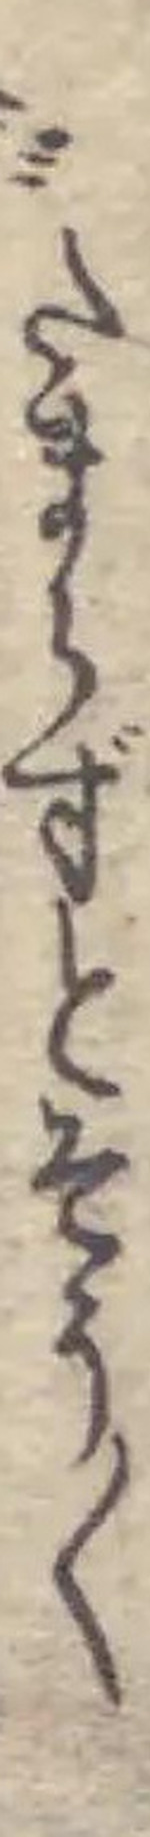たまらずとそう〳〵
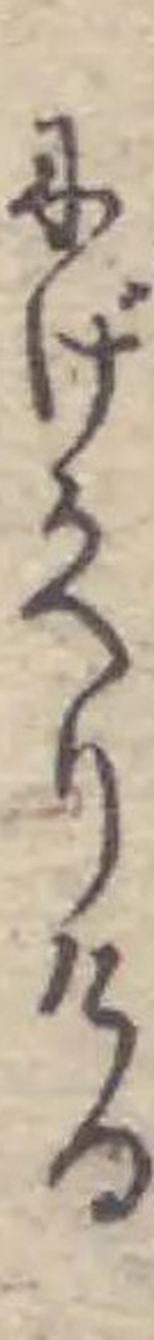にげかへりける
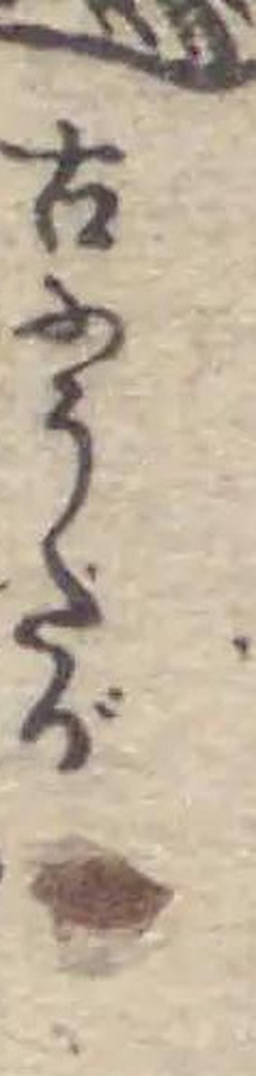古ふうたが
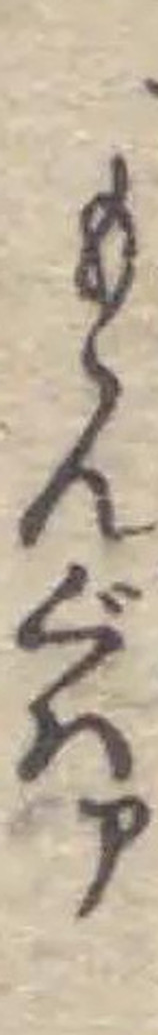もゝんぐはァ

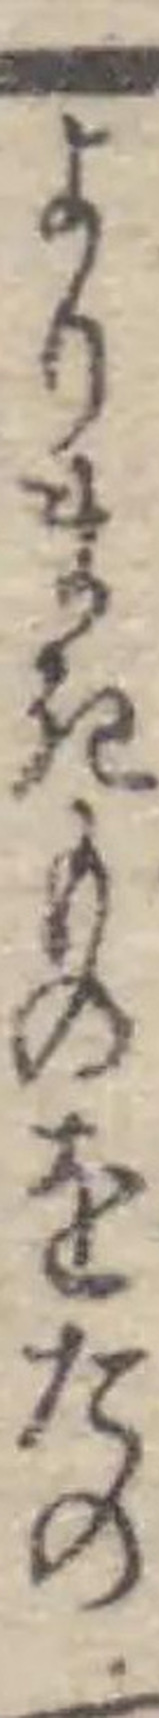よりまきものをたの
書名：作意妖恐懼感心 2巻
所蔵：国立国会図書館 National Diet Library, JAPAN
